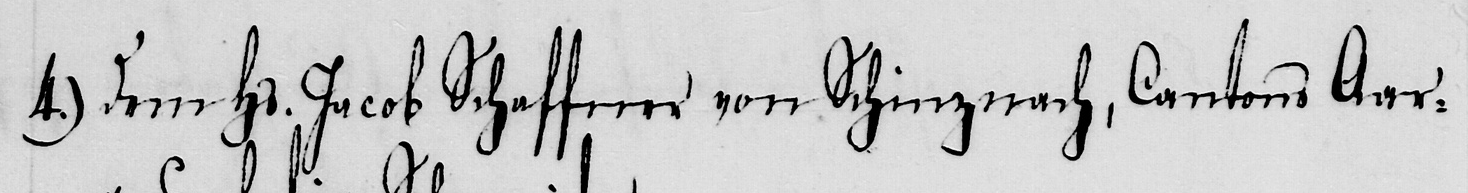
4.) Dem Hs. Jacob Schaffner von Schinznach, Cantons Aar¬
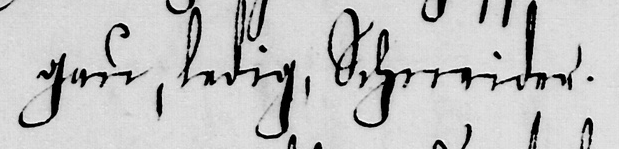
gau, ledig, Schneider.
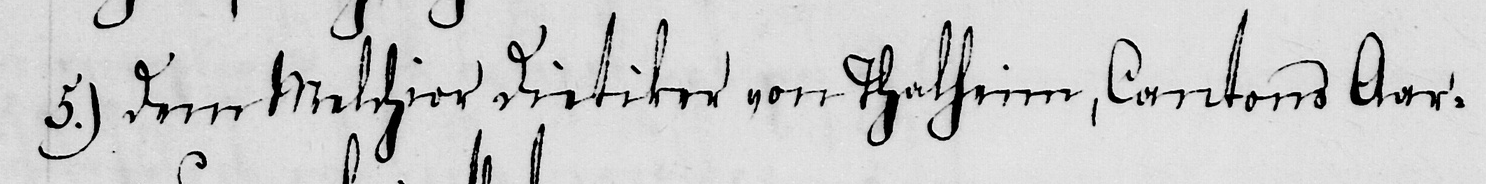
5.) Dem Melchior Dietiker von Thalheim, Cantons Aar¬
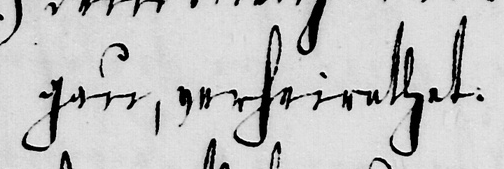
gau, verheirathet.
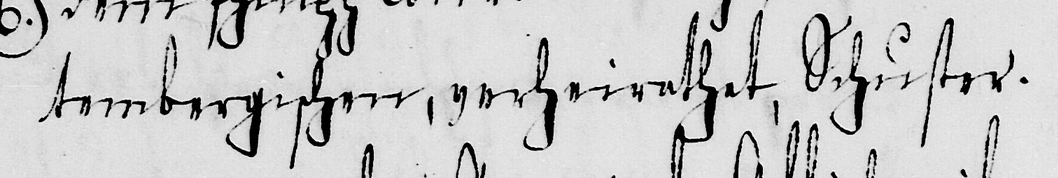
tembergischen, verheirathet, Schuster.
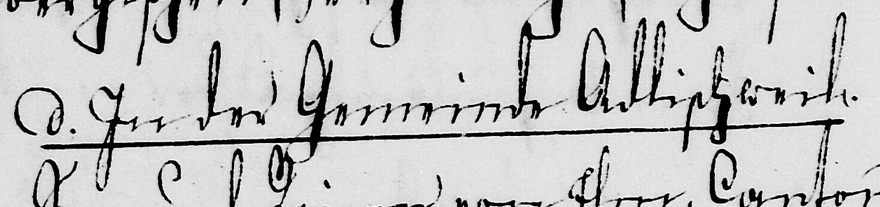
d. In der Gemeinde Adlischweil.
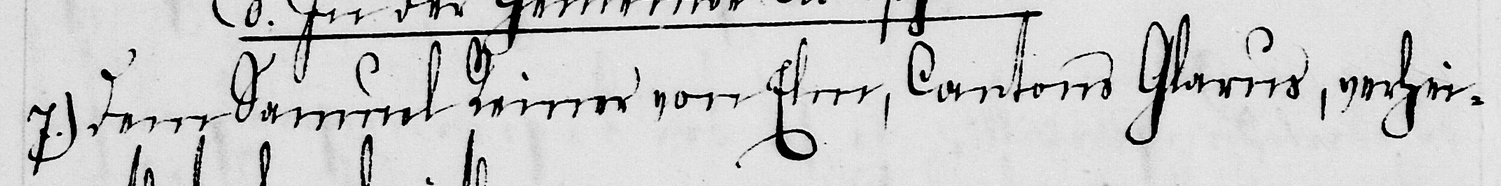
7.) Dem Samuel Reiner von Elm, Cantons Glarus, verhei¬
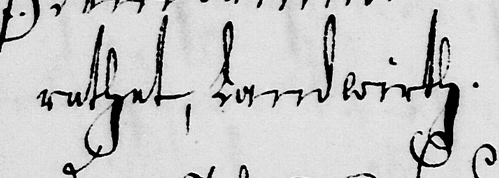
rathet, Landwirth.
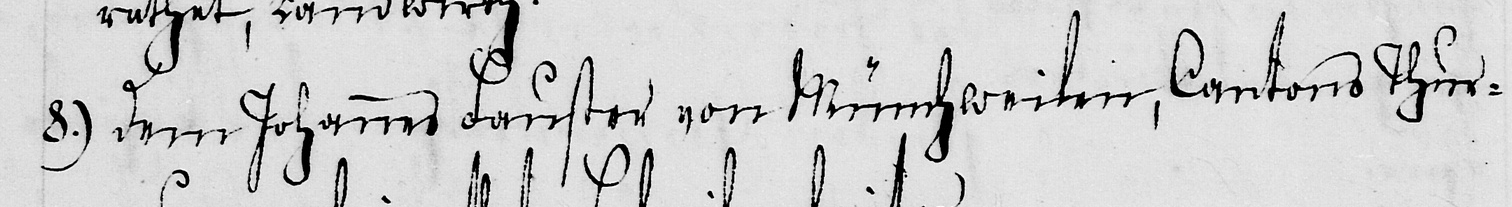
8.) Dem Johannes Fauster von Münchweilen, Cantons Thur¬
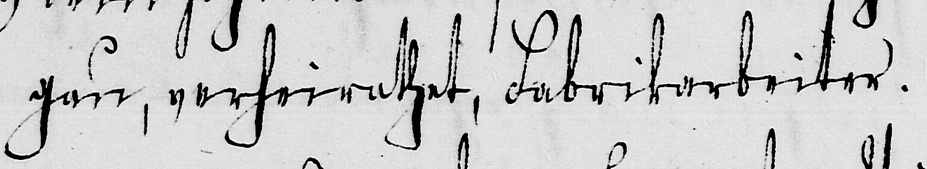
gau, verheirathet, Fabrikarbeiter.
